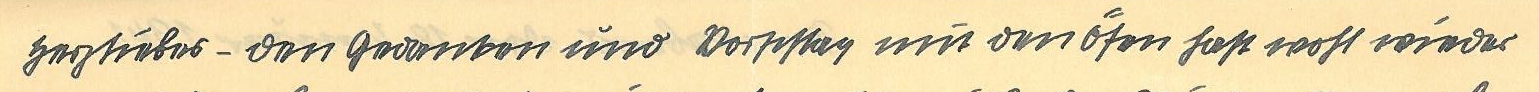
Herzliebes – den Gedanken und Vorschlag mit den Öfen hast wohl wieder
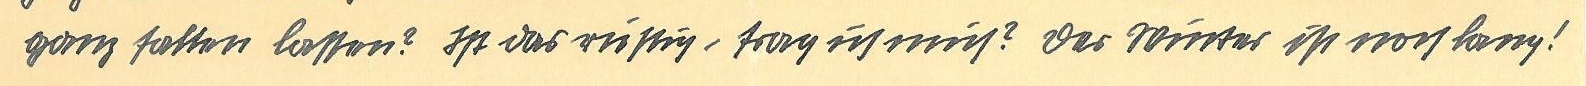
ganz fallen lassen? Ist das richtig, frag ich mich? Der Winter ist noch lang!
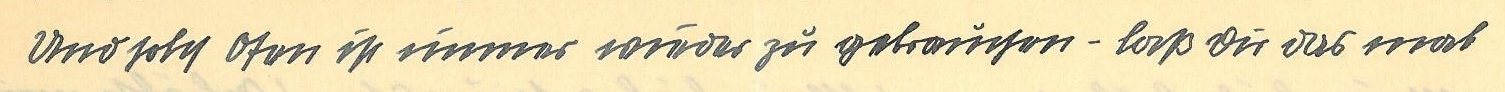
Und solch Ofen ist immer wieder zu gebrauchen – laß Dir das mal
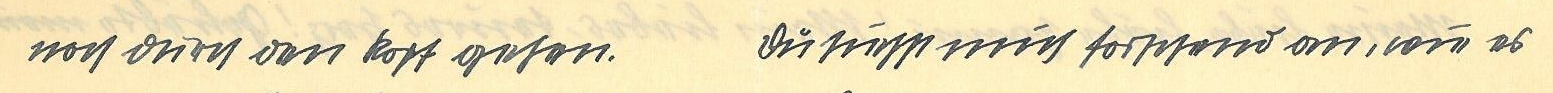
noch durch den Kopf gehen. Du siehst mich forschend an, wie es
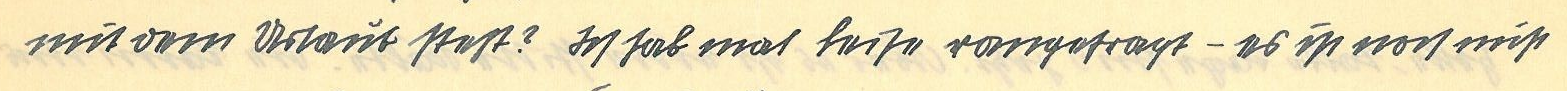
mit dem Urlaub steht? Ich hab mal leise rangefragt – es ist noch nicht
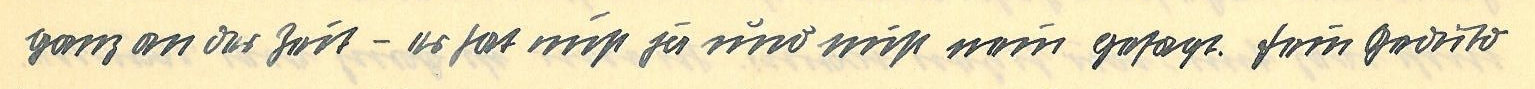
ganz an der Zeit – er hat nicht ja und nicht nein gesagt. Fein Geduld
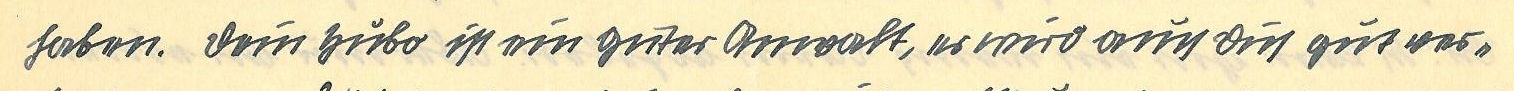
haben. Dein Hubo ist ein guter Anwalt, er wird auch Dich gut ver¬
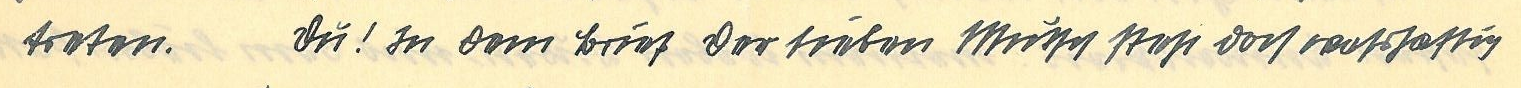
treten. Du! In dem Brief der lieben Mutsch steht doch wahrhaftig
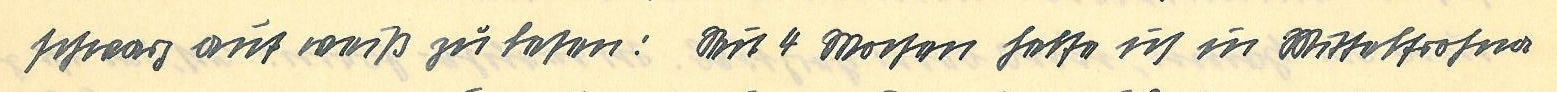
schwarz auf weiß zu lesen: Seit 4 Wochen helfe ich in M.
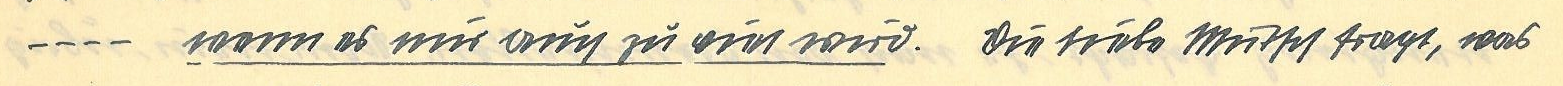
– – – – wenn es mir auch zu viel wird. Die liebe Mutsch fragt, was
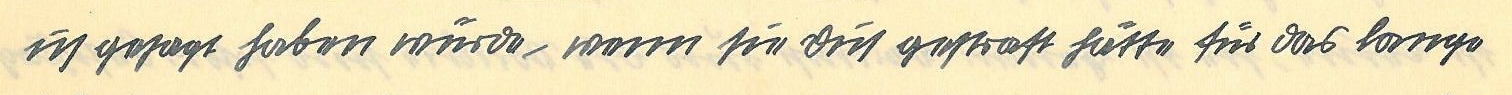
ich gesagt haben würde, wenn sie Dich gestraft hätte für das lange
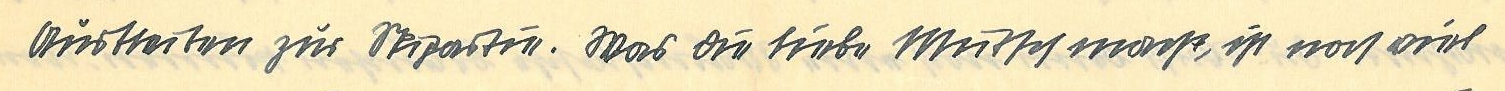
Ausbleiben zur Skipartie. Was die liebe Mutsch macht, ist noch viel
